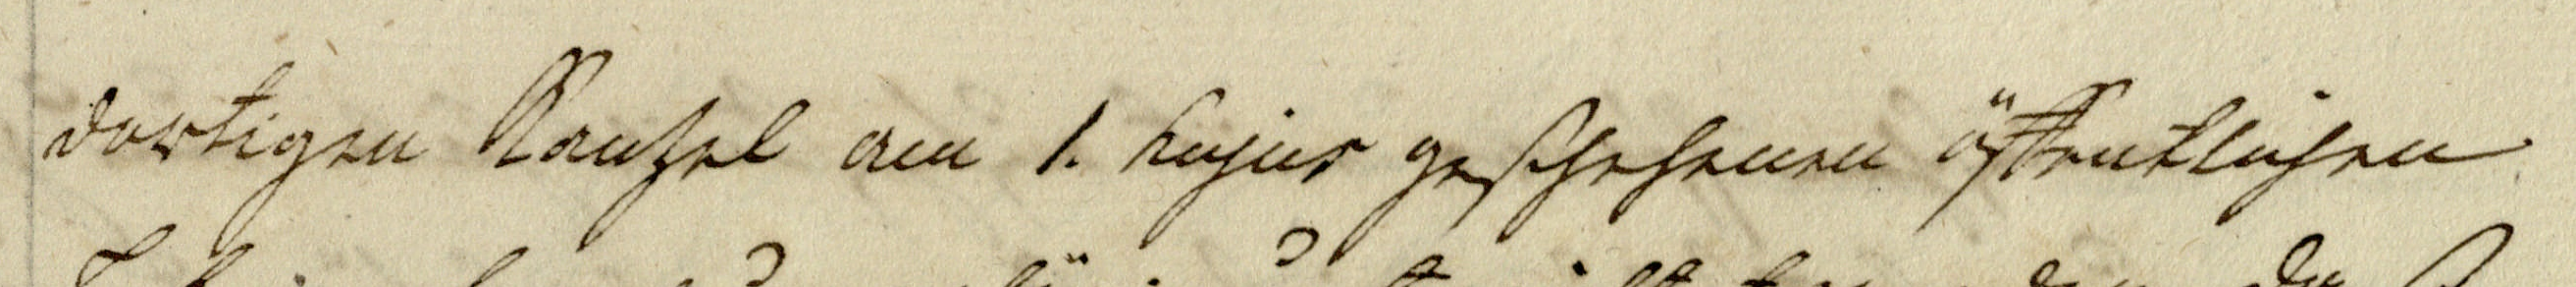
dortigen Kanzel am 1. hujus geschehenen öffentlichen
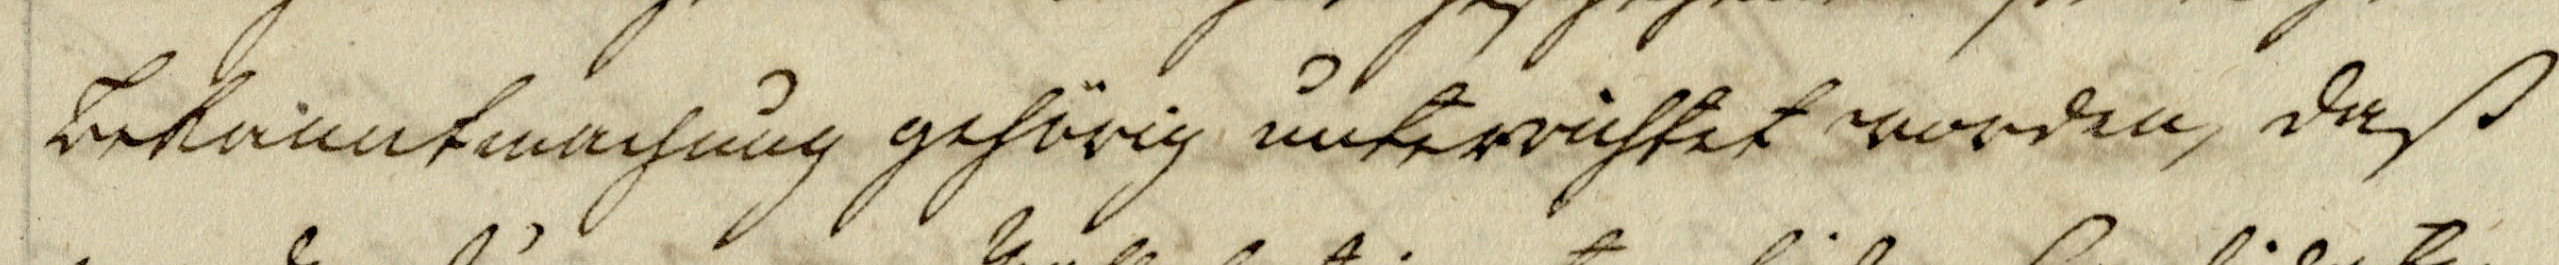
Bekanntmachung gehörig unterrichtet worden, daß
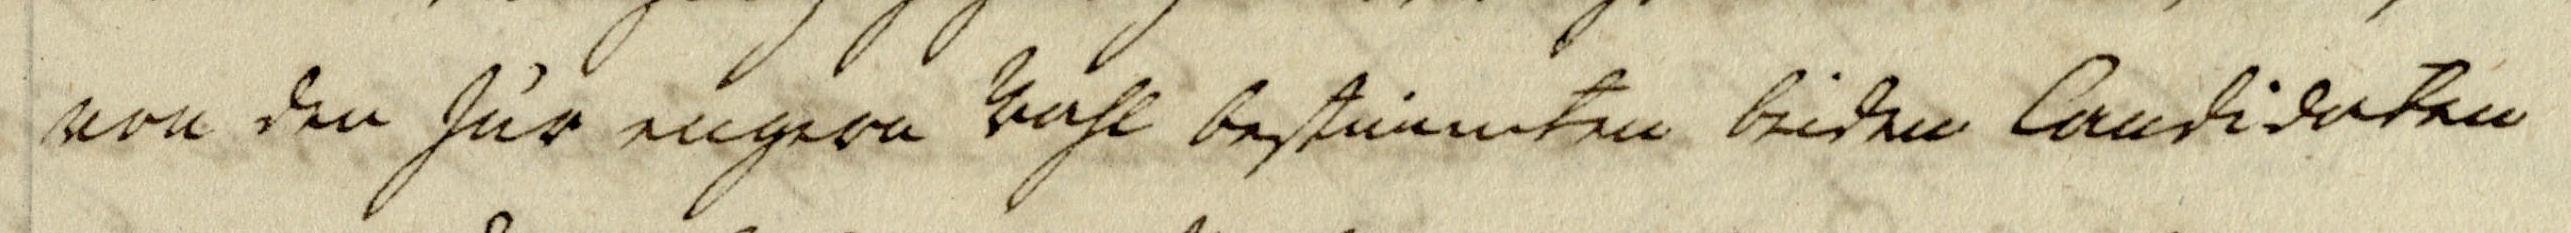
von den zur engern Wahl bestimmten beiden Candidaten
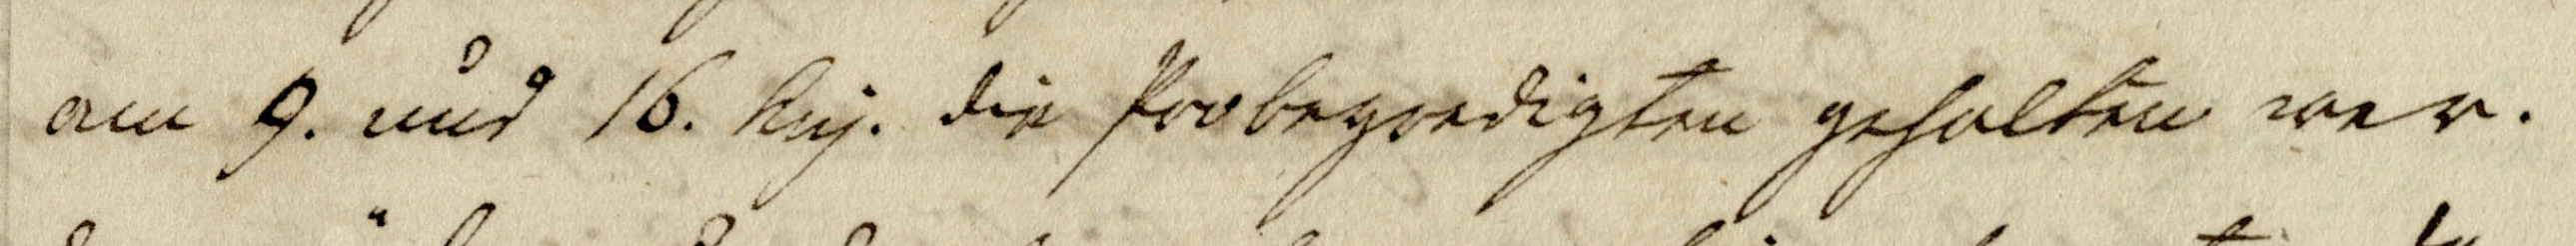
am 9. und 16. huj. die Probegredigten gehalten wer¬
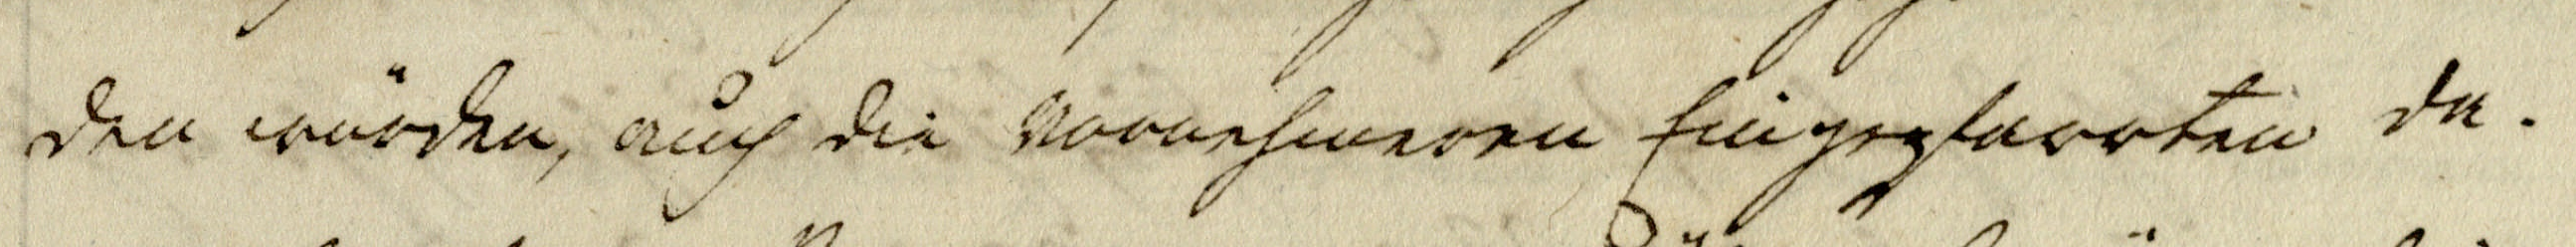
den würden, auch die vornehmeren Eingepfarrten da¬
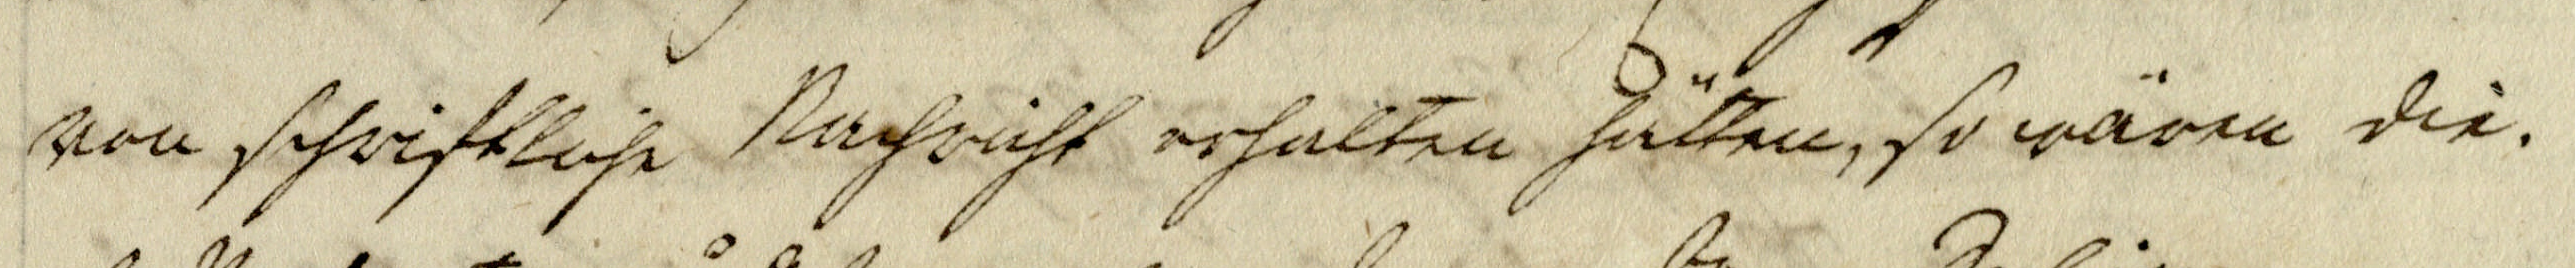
von schriftliche Nachricht erhalten hätten, so wären die¬
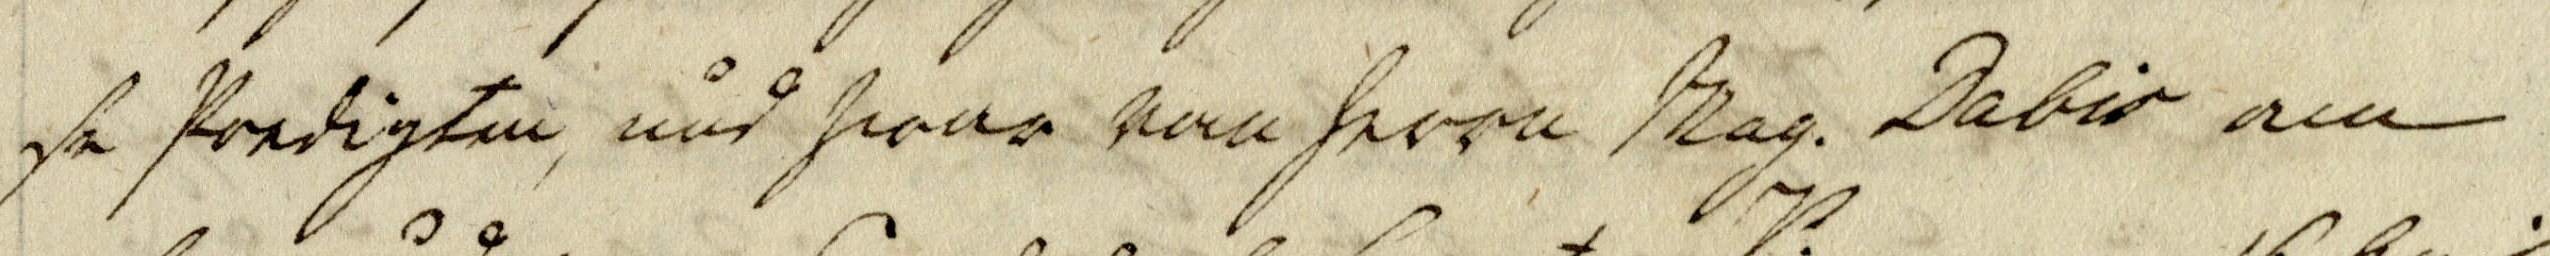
se Predigten, und zwar vom Herrn Mag. Dabis am
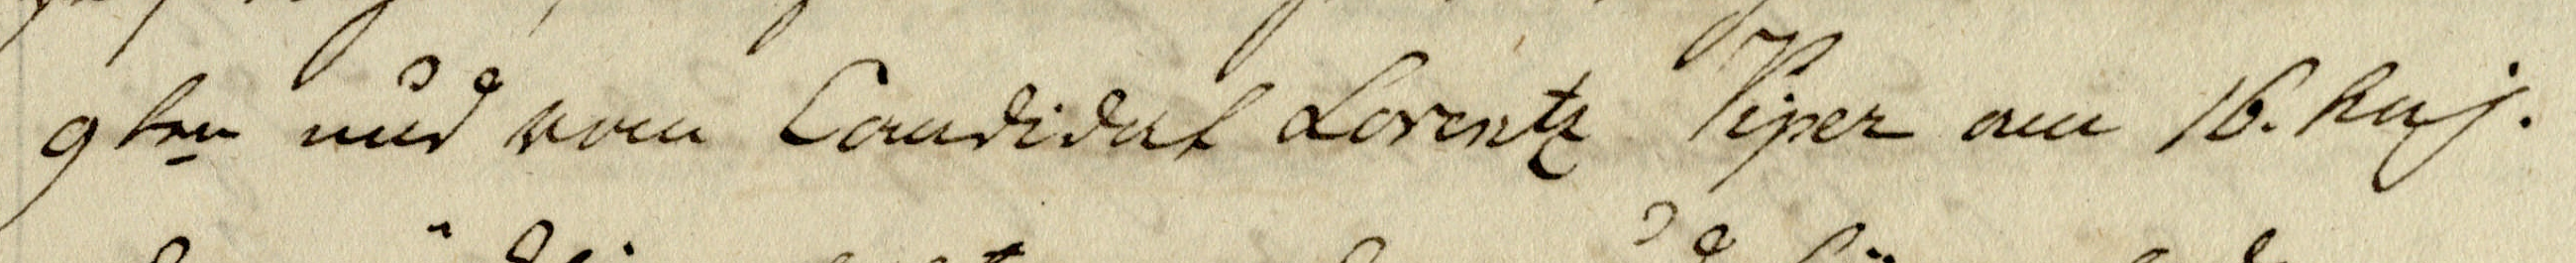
9 ten und vom Candidat Lorentzl Piper am 16. huj.
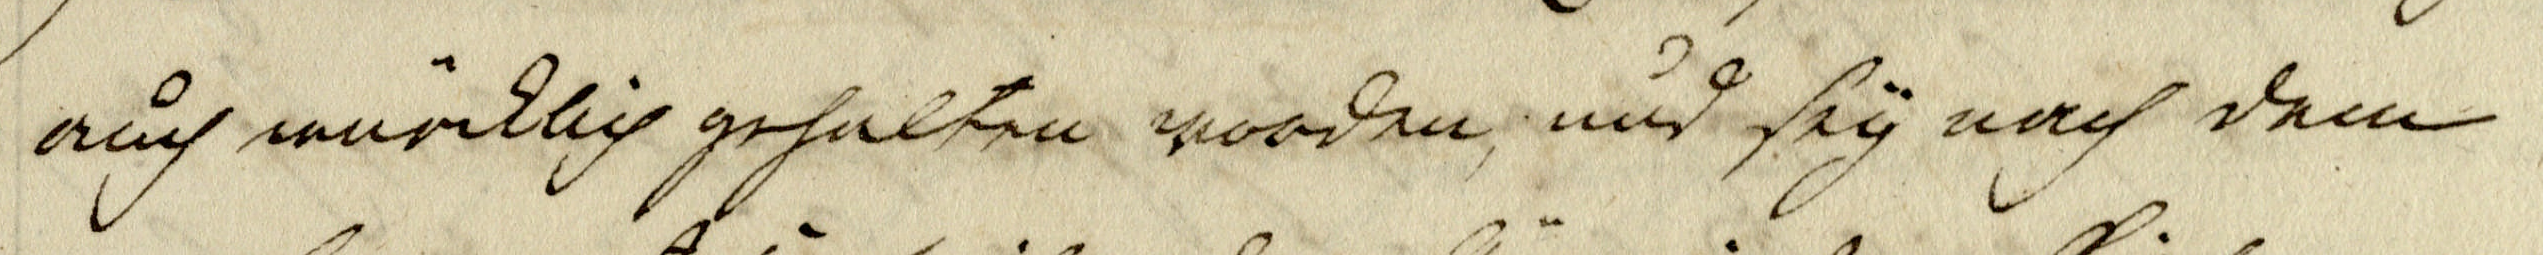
auch würcklich gehalten worden und seÿ nach dem
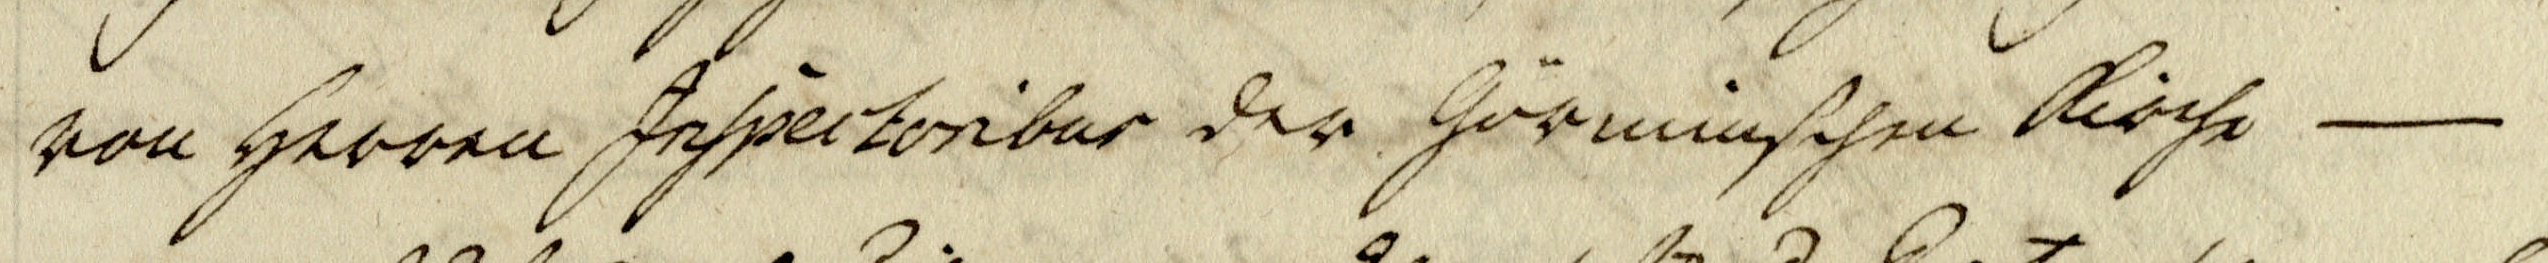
von Herren Inspectoribus der Görminschen Kirche
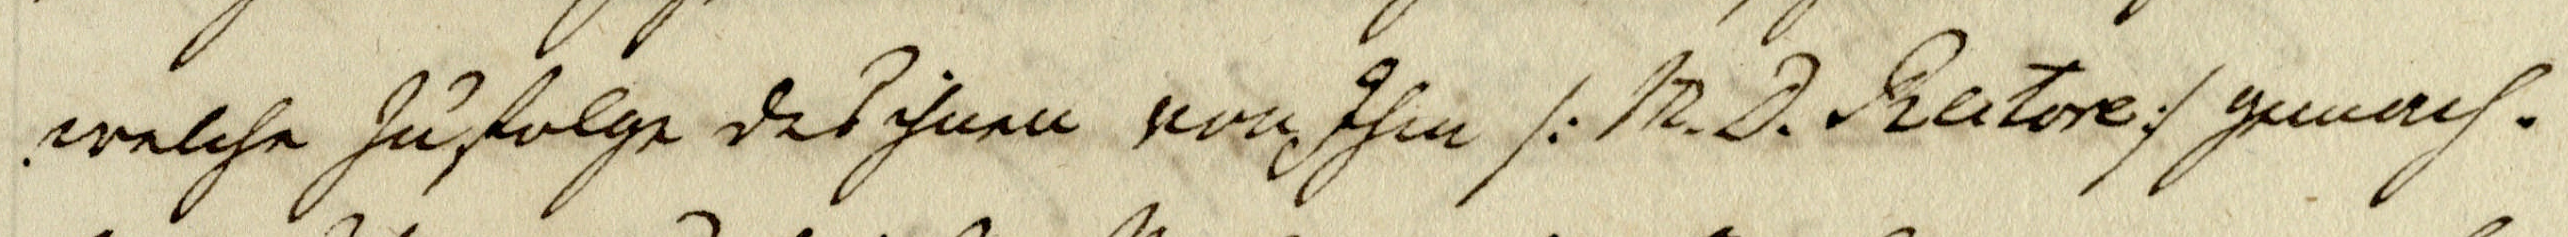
welche zufolge des ihnen von Ihm /: M. D. Rrectore :/ gemach¬
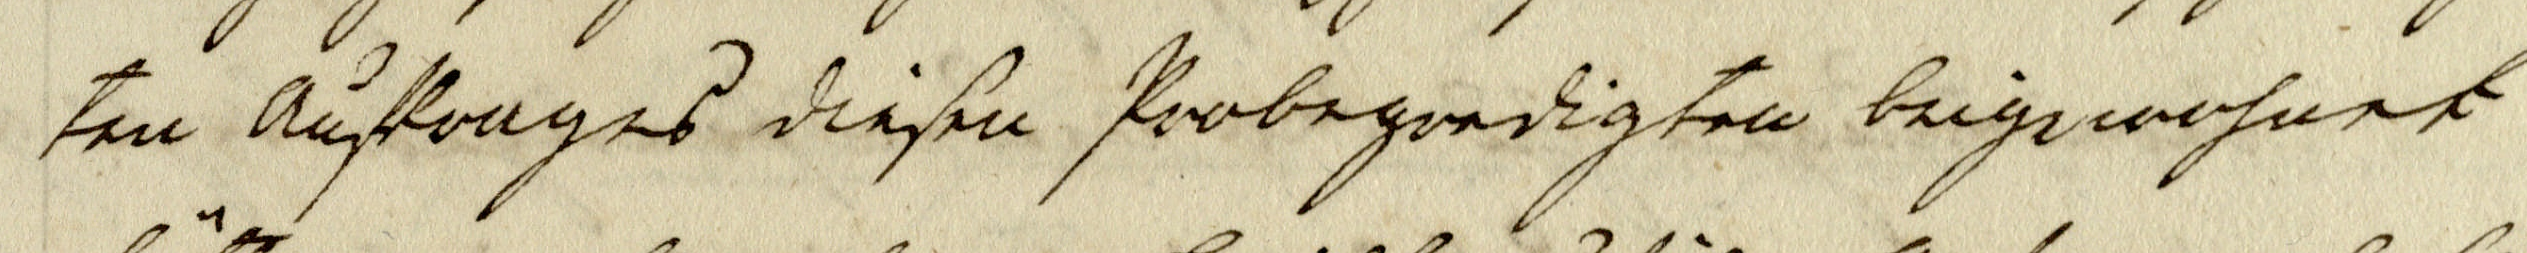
ten Auftrages diesen Probegredigten beigewohnet
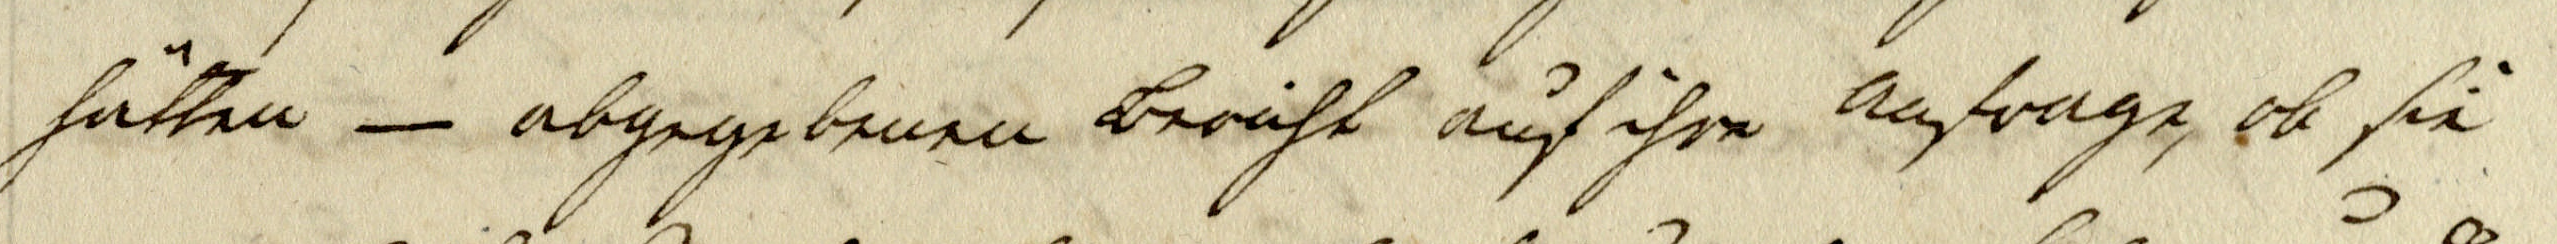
hätten abgegebenen Bericht auf ihre Anfrage, ob sie
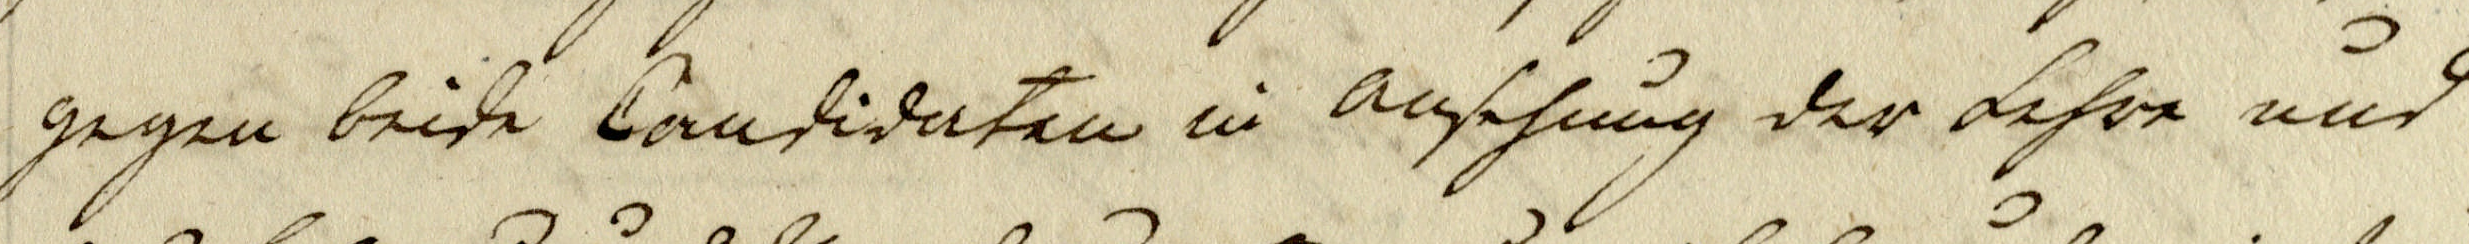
gegen beide Candidaten in Ansehung der Lehre und
